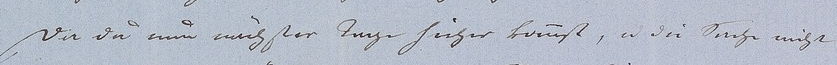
Da du nun nächster Tage hieher kommst, u die Sache nicht
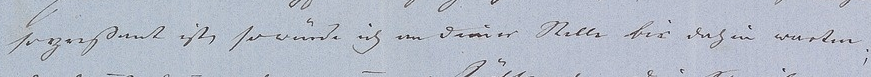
so preßant ist, so würde ich an deiner Stelle bis dahin warten;
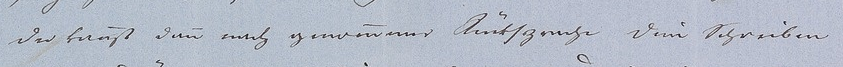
du kannst dann nach genommener Rücksprache dein Schreiben
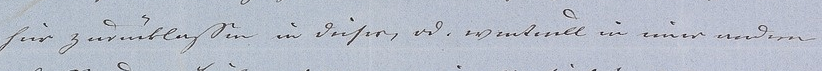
hier zurücklassen in dieser, od. eventuell in einer andern
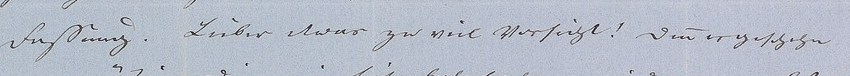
Fassung. Lieber etwas zu viel Vorsicht! Denn es geschehn
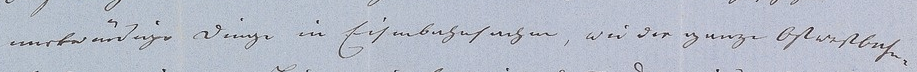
merkwürdige Dinge in Eisenbahnsachen, wie der ganze Ostwestbahn-
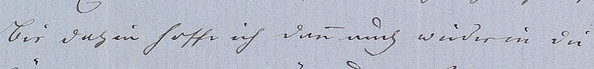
Bis dahin hoffe ich dann auch wieder in die
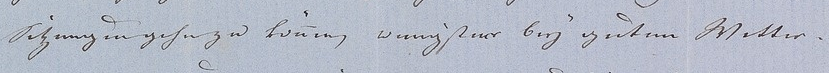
Sitzungen gehn zu können, wenigstens bey gutem Wetter. –
